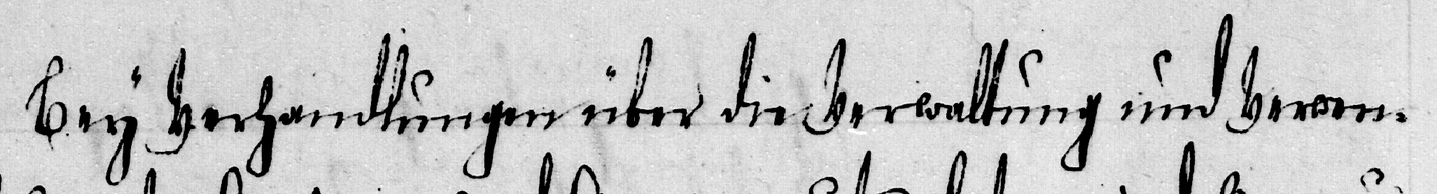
Bey Verhandlungen über die Verwaltung und Verwen¬
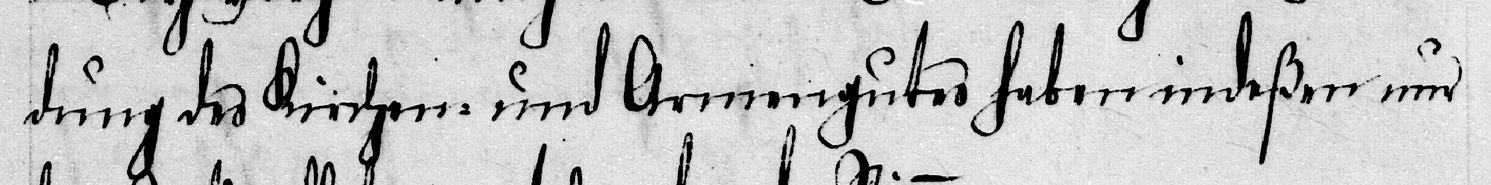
dung des Kirchen- und Armengutes haben indeßen nur
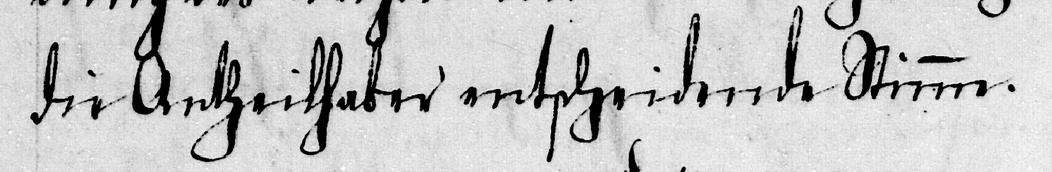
die Antheilhaber entscheidende Stimme.
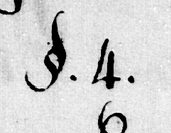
§. 4.
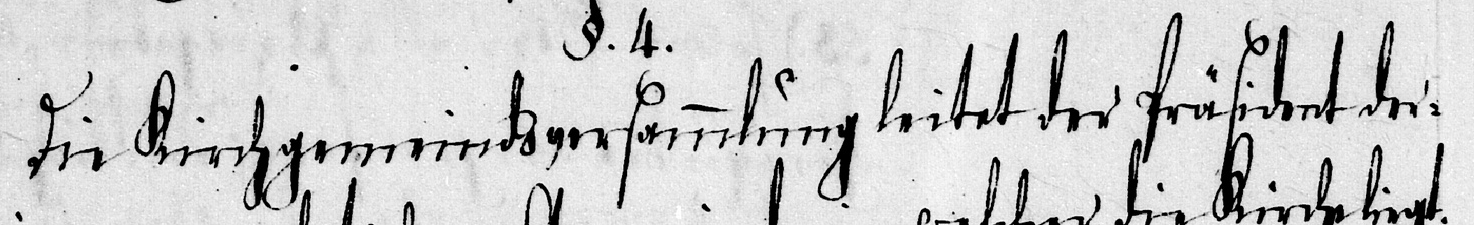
Die Kirchgemeindsversammlung leitet der Präsident de¬
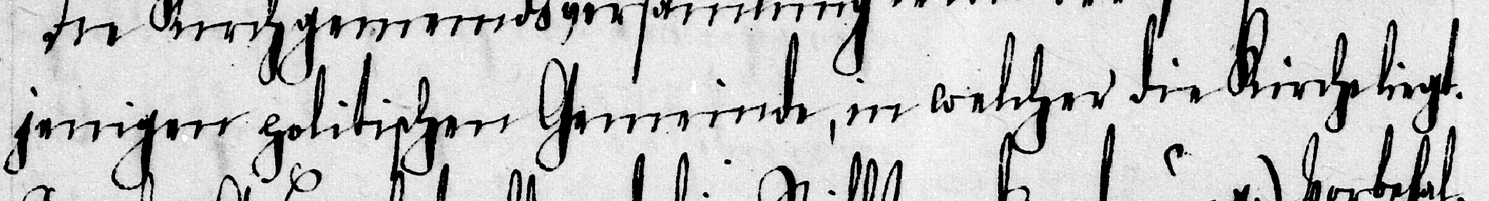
jenigen politischen Gemeinde, in welcher die Kirche lieg¬
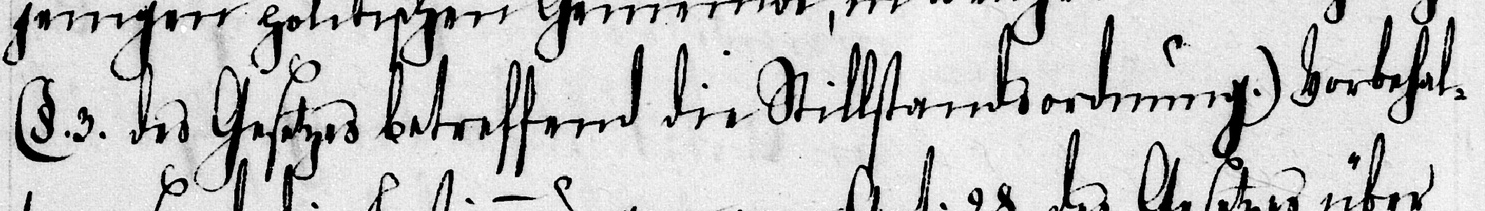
des Gesetzes betreffend die Stillstandsordnung.) Vorbehal¬
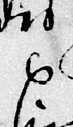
s¬
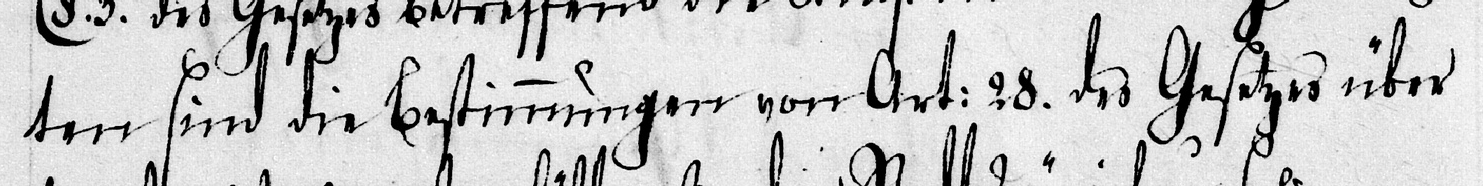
ten sind die Bestimmungen von Art: 28. des Gesetzes über
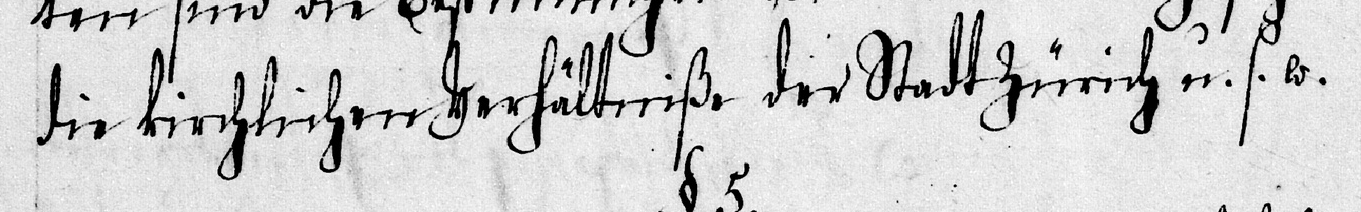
die kirchlichen Verhältniße der Stadt Zürich u.s.w.
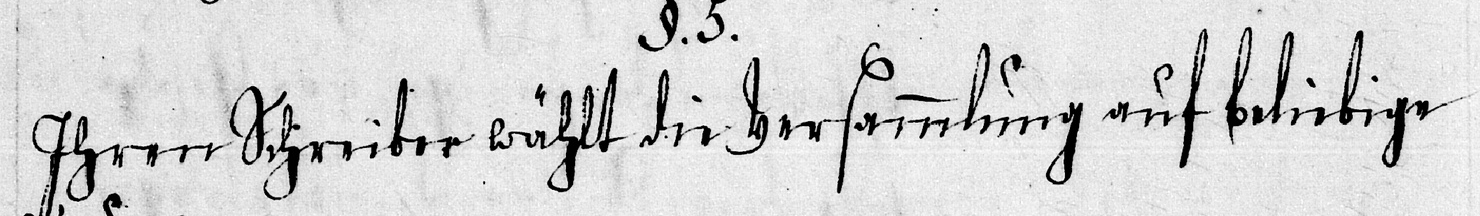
Ihren Schreiber wählt die Versammlung auf beliebige
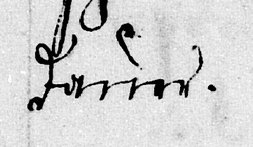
Dauer.
